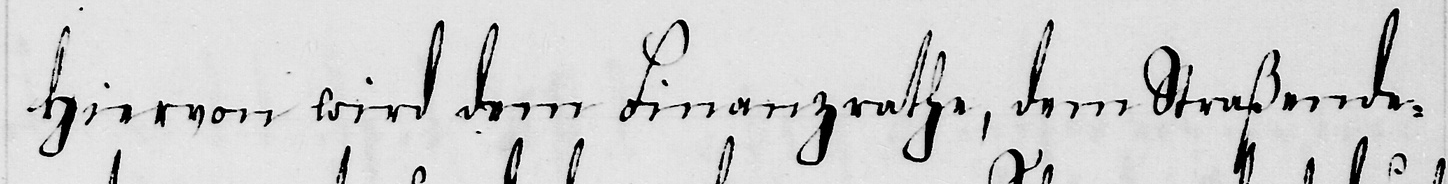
Hiervon wird dem Finanzrathe, dem Straßende¬
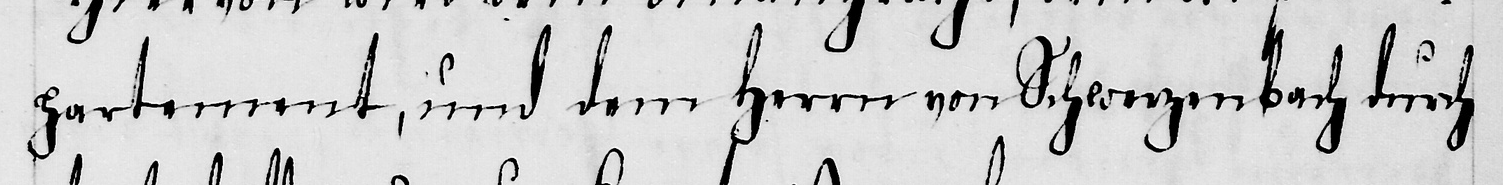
partement, und dem Herrn von Schwerzenbach durch
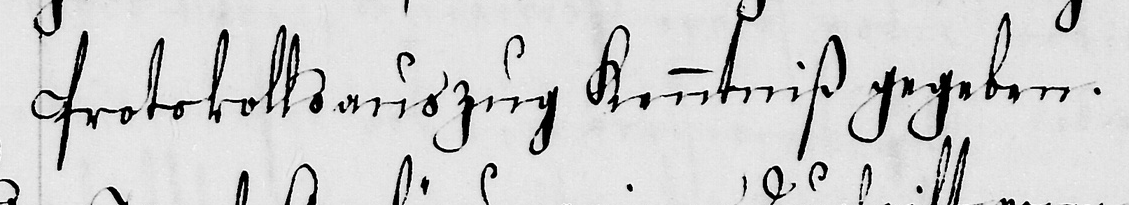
Protokollsauszug Kenntniß gegeben.
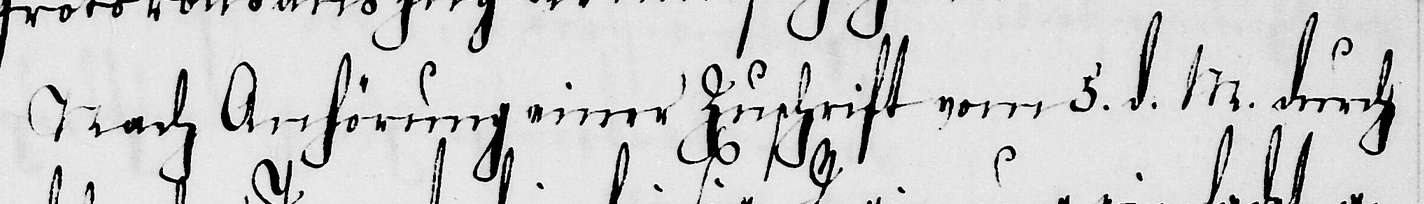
Nach Anhörung einer Zuschrift vom 5. d. M. durch
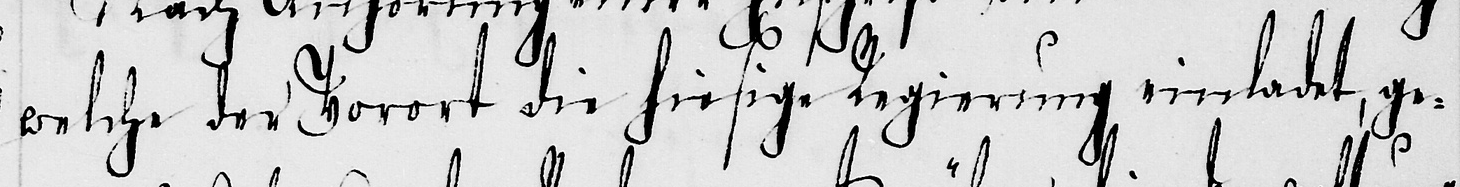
welche der Vorort die hiesige Regierung einladet, ge¬
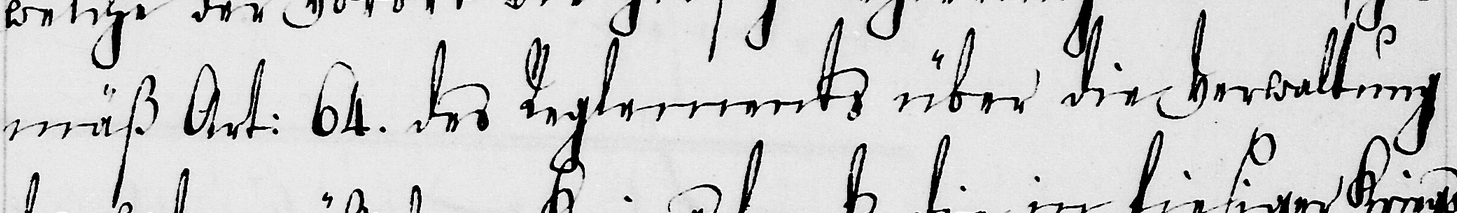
mäß Art: 64. des Reglements über die Verwaltung
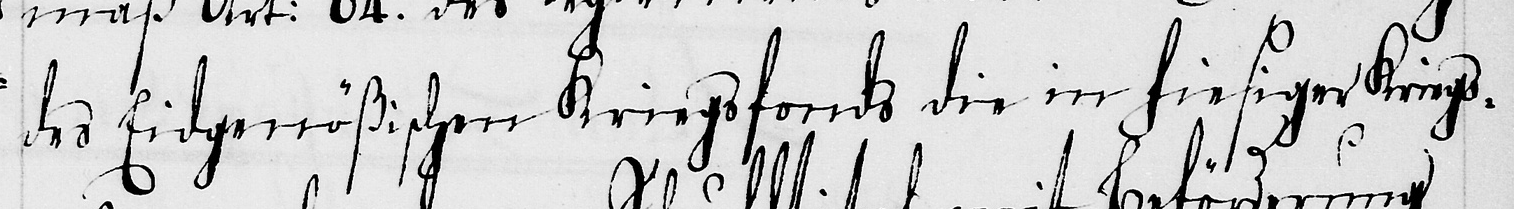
des Eidgenößischen Kriegsfonds die in hiesiger Kriegs¬
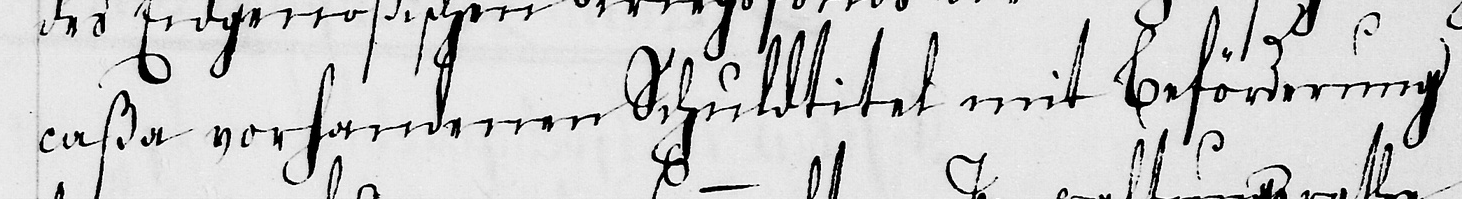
caßa vorhandenen Schuldtitel mit Beförderung
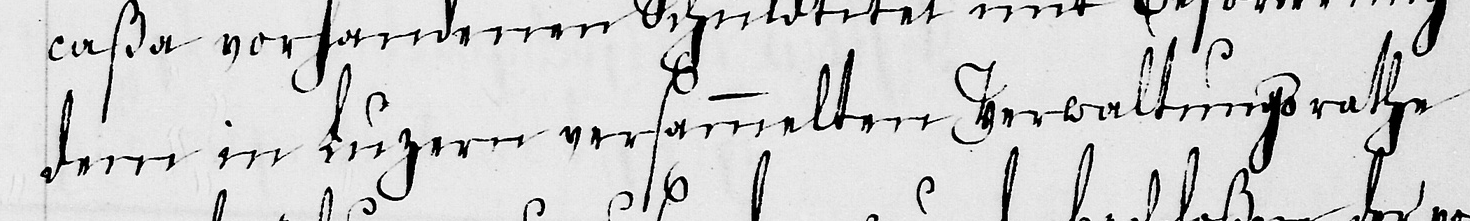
dem in Luzern versammelten Verwaltungsrathe
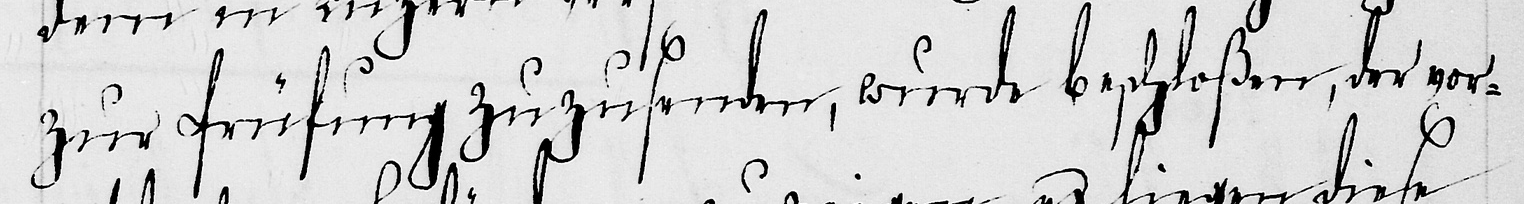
zur Prüfung zuzusenden, wurde beschloßen, der vor¬
